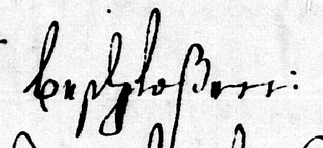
beschloßen:
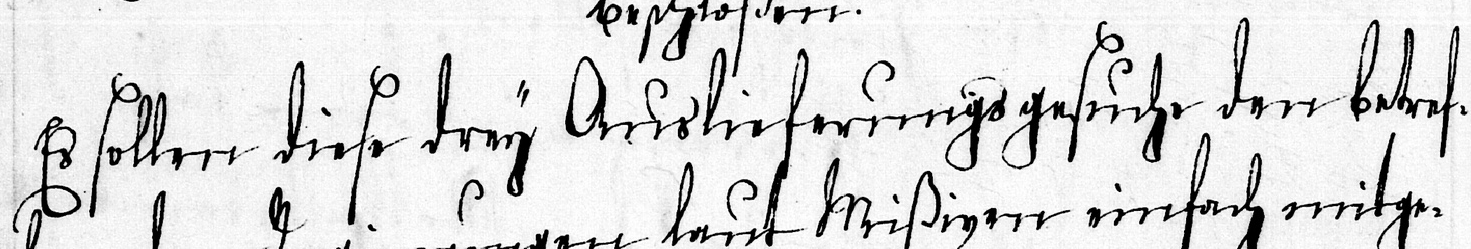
Es sollen diese Auslieferungsgesuche den betr¬
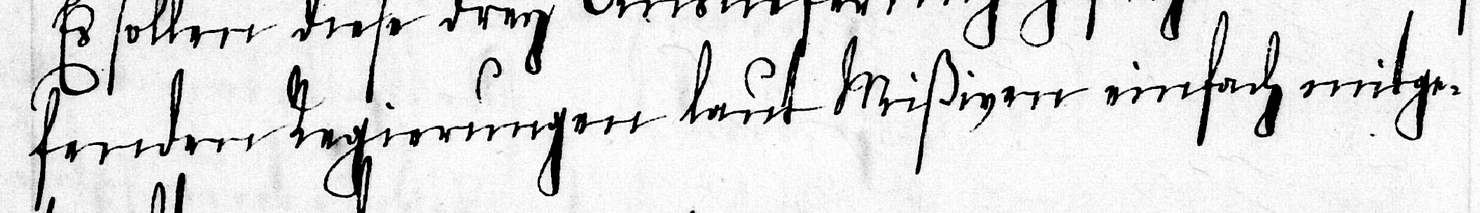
fenden Regierungen laut Mißiven einfach mitge¬
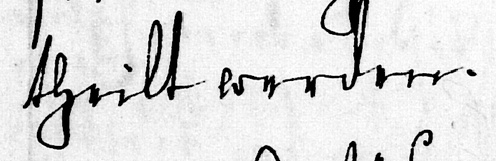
theilt werden.
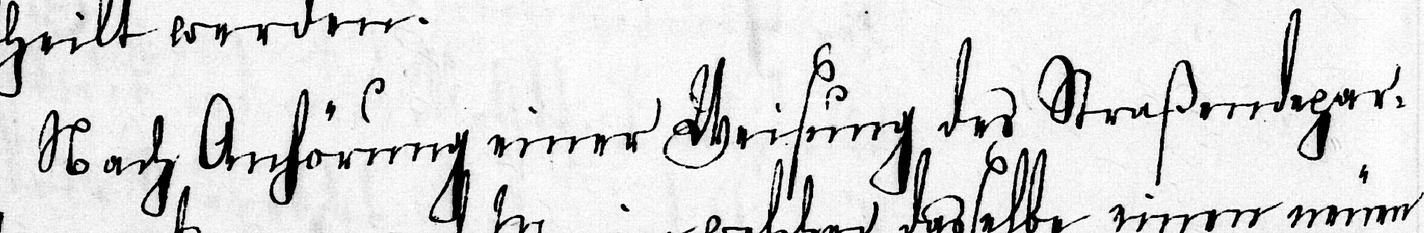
Nach Anhörung einer Weisung des Straßendepar¬
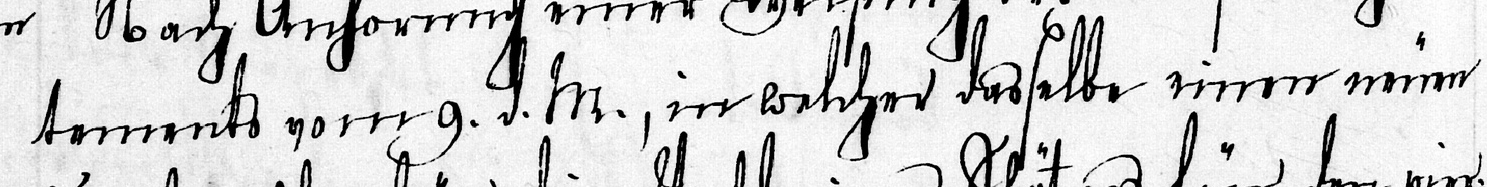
tements vom 9. d. M., in welcher dasselbe einen neuen
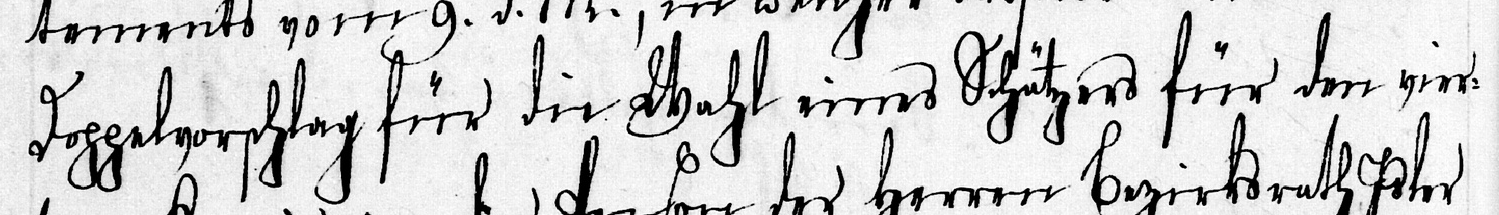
Doppelvorschlag für die Wahl eines Schätzers für den vier¬
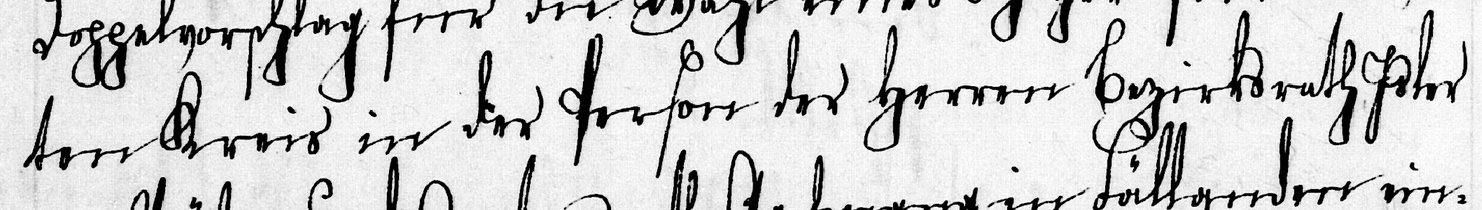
ten Kreis in der Person der Herren Bezirksrath Isler
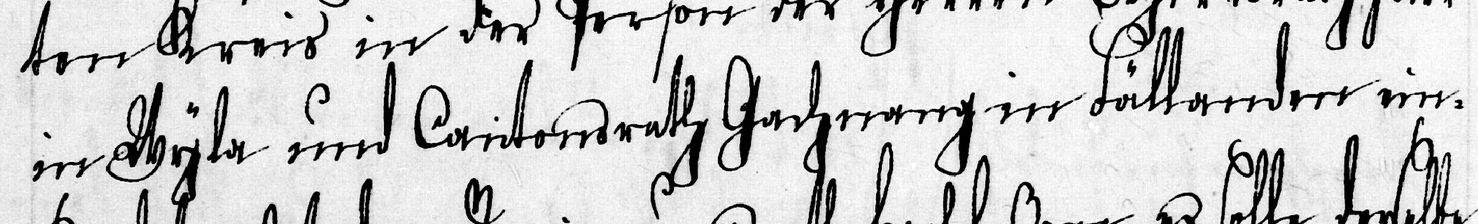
in Wyla und Cantonsrath Gachnang in Fällanden ein¬
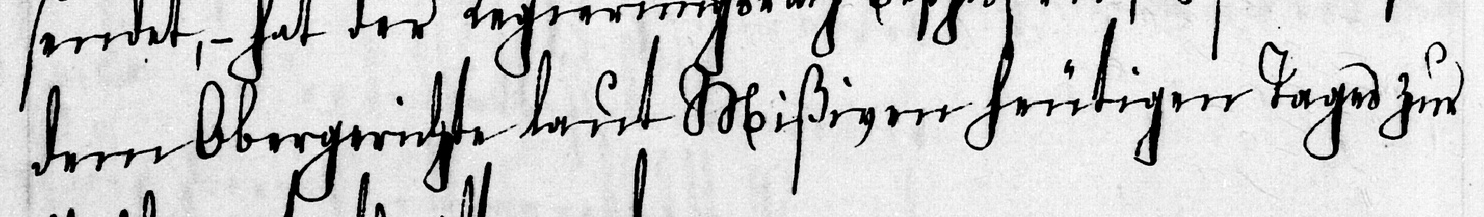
dem Obergerichte laut Mißiven heutigen Tages zur
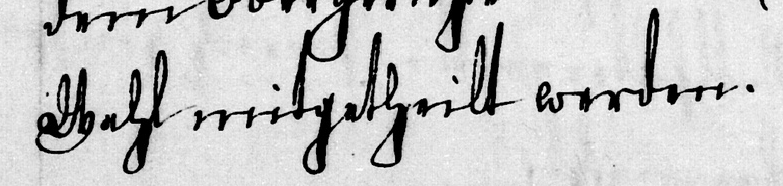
Wahl mitgetheilt werden.
